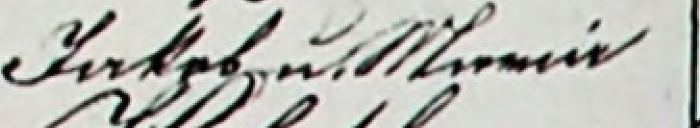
Jakob u. Maria
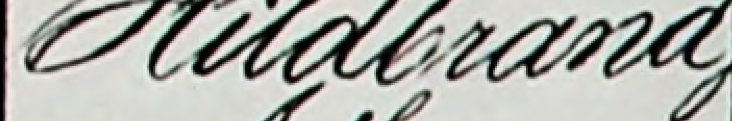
Hildbrand
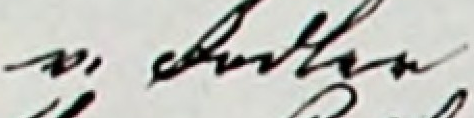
v. Jodler
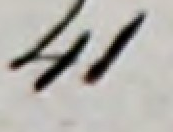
41
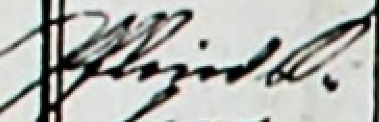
Pflinds„
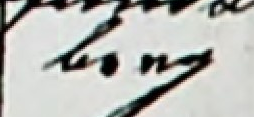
berg
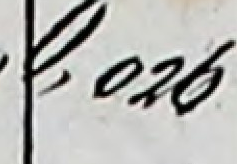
0,026
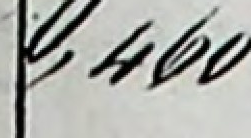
0,460
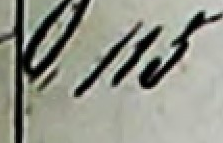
0,115
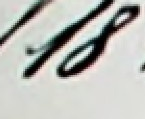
18
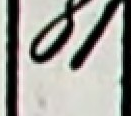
81
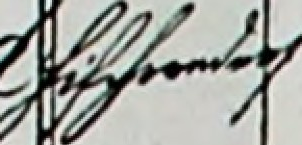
Fischerndorf
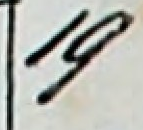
19
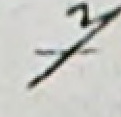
7
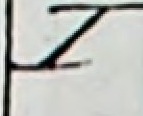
I
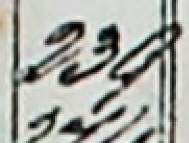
230
